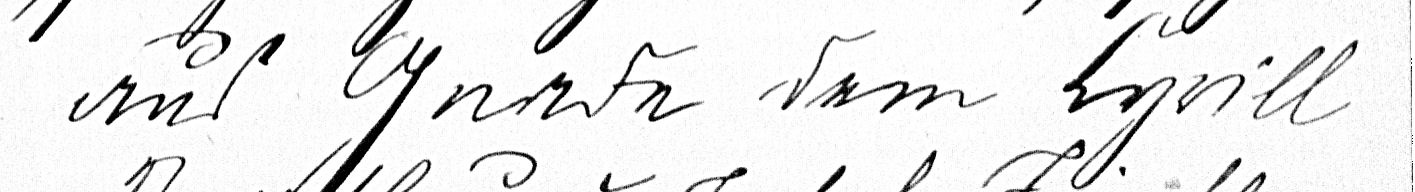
aus Gnade dem Cyrill
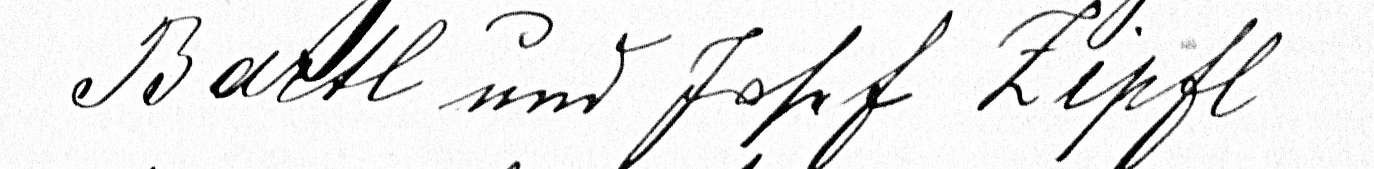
Bartl und Josef Zipfl
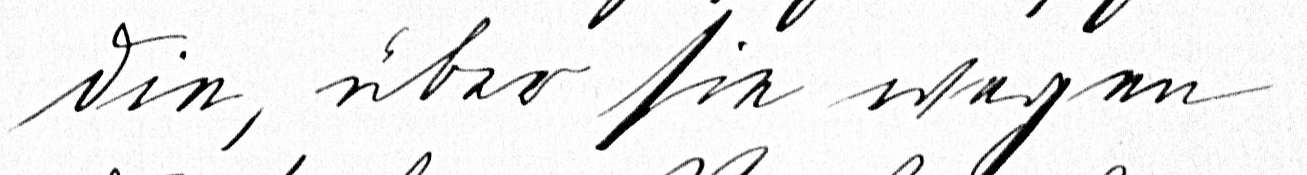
die, über sie wegen
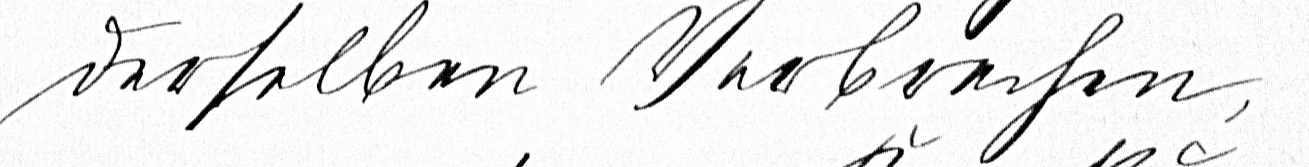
derselben Verbrechen,
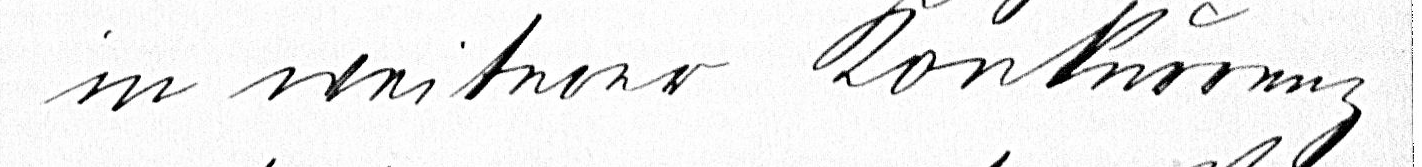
in weiterer Konkurrenz
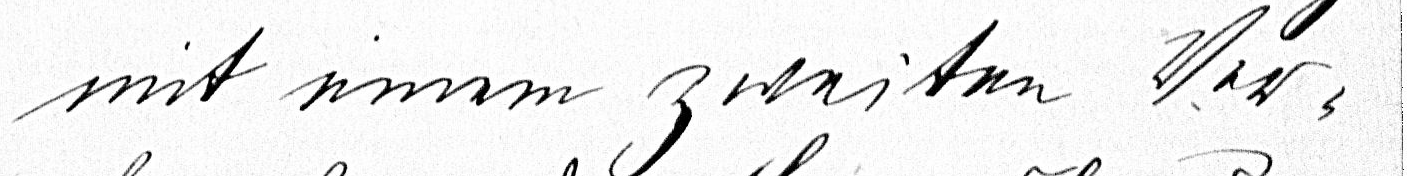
mit einem zweiten Ver¬
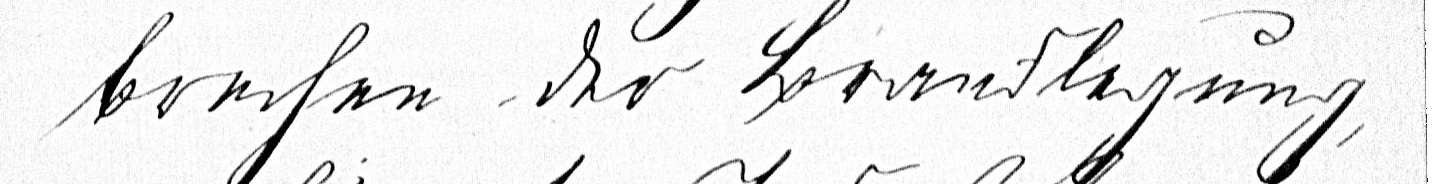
brechen der Brandlegung,
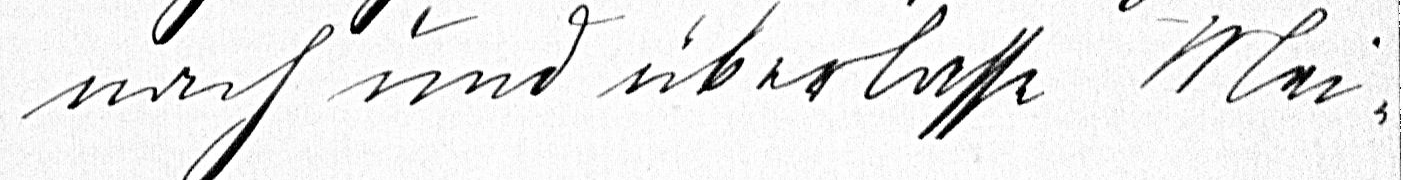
nach und überlasse Mei-
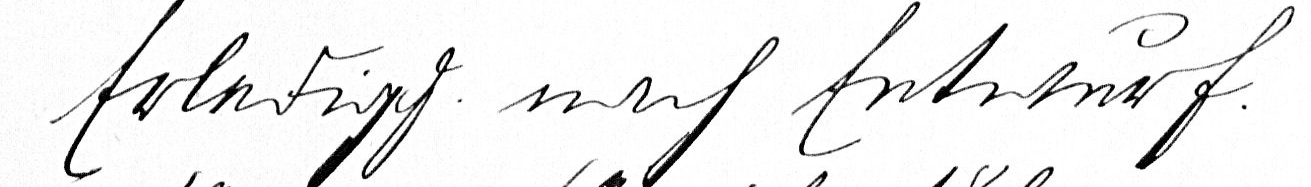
Erledisch. nach Entwurf.
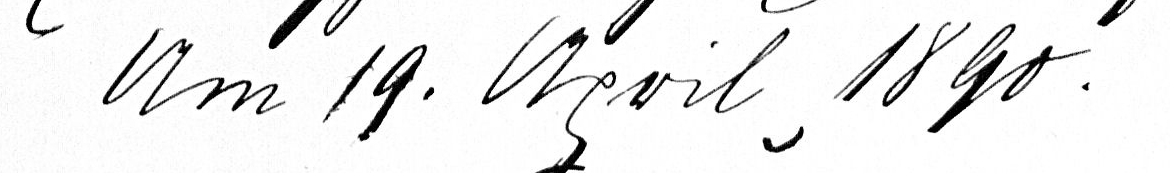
Am 19. April 1890.
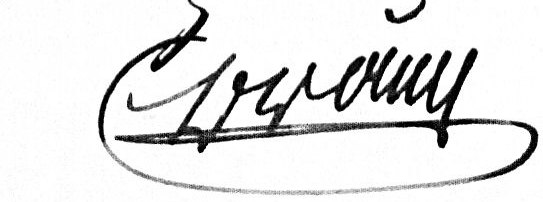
xx
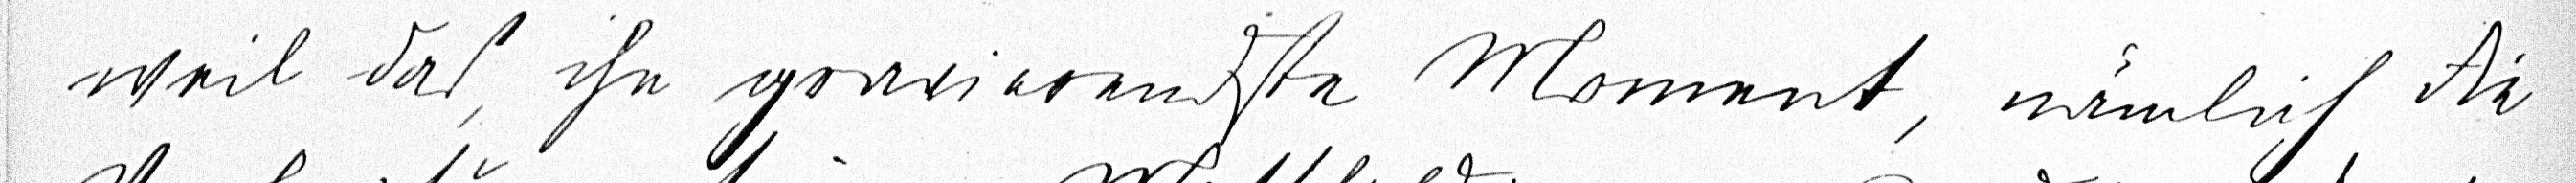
weil das, ihn gravierendste Moment, nämlich die
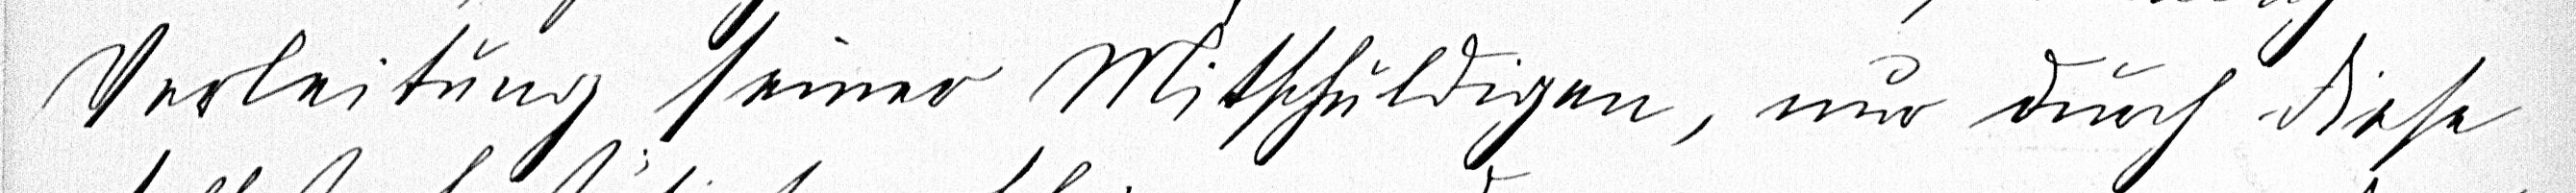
Verleitung seiner Mitschuldigen, nur durch diese
